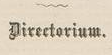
Directorium.
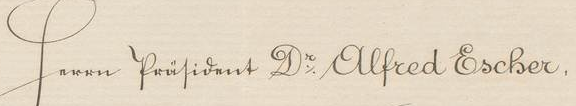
Herrn Präsident Dr Alfred Escher,
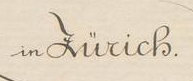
in Zürich.
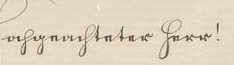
Hochgeachteter Herr!
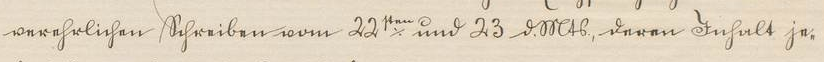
verehrlichen Schreiben vom 22sten und 23 d. Mts., deren Inhalt je-
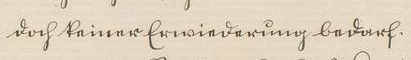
doch keiner Erwiederung bedarf.
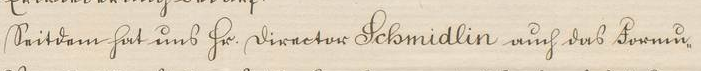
Seitdem hat uns Hr. Director Schmidlin auch das Formu-
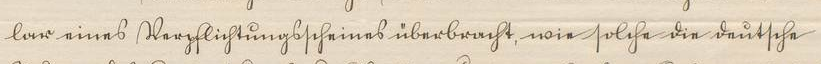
lar eines Verpflichtungsscheines überbracht, wie solche die deutsche
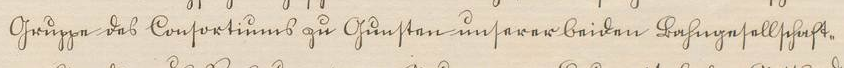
Gruppe des Consortiums zu Gunsten unserer beiden Bahngesellschaft-
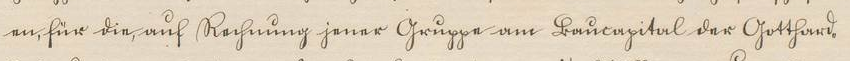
en, für die, auf Rechnung jener Gruppe am Baucapital der Gotthard -
